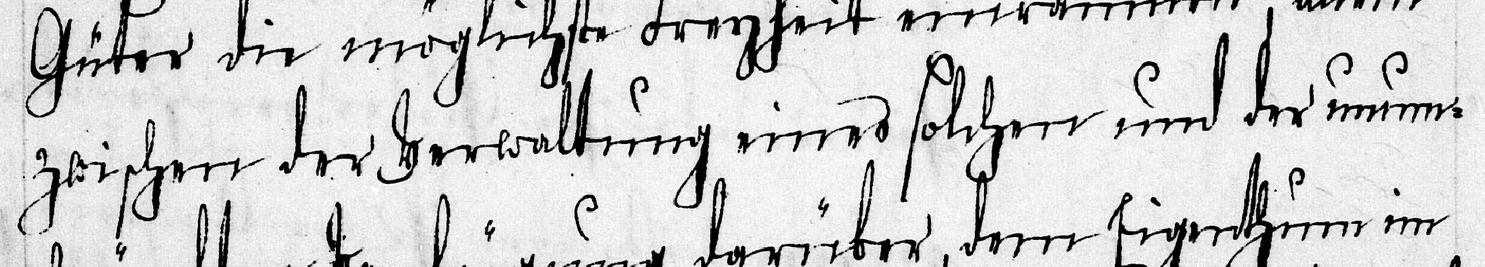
zwischen der Verwaltung eines solchen und der unum¬
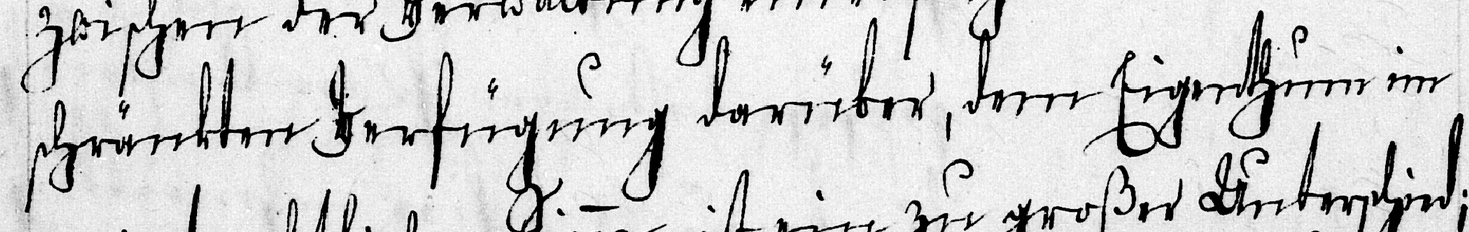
schränkten Verfügung darüber, dem Eigenthum im
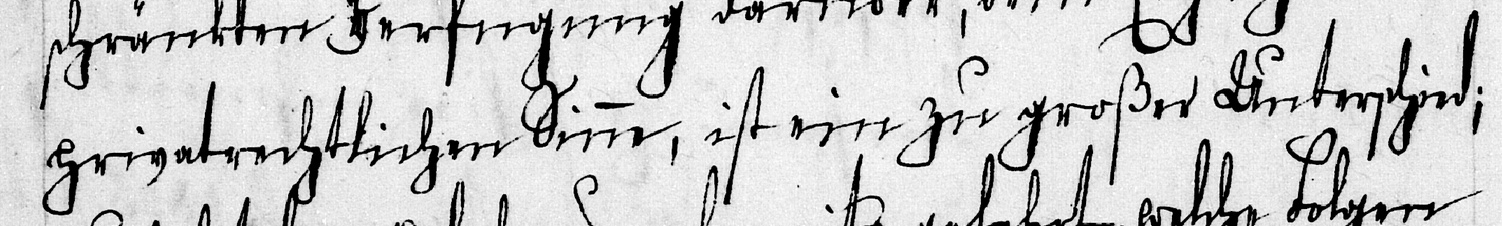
privatrechtlichen Sinne, ist ein zu großer Unterschied;
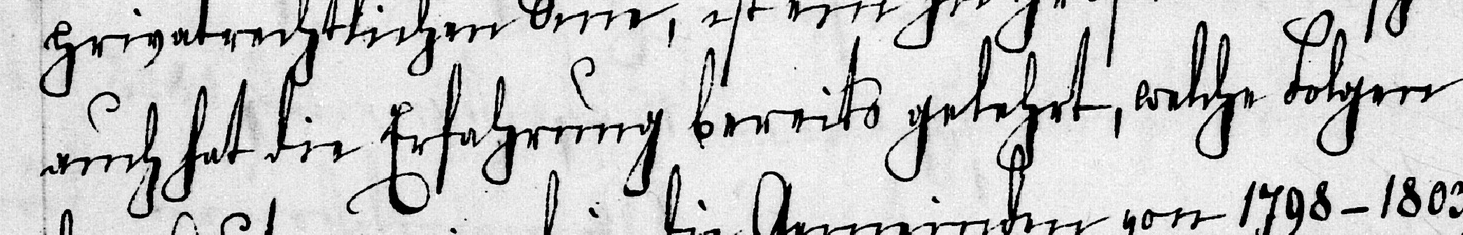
auch hat die Erfahrung bereits gelehrt, welche Folgen
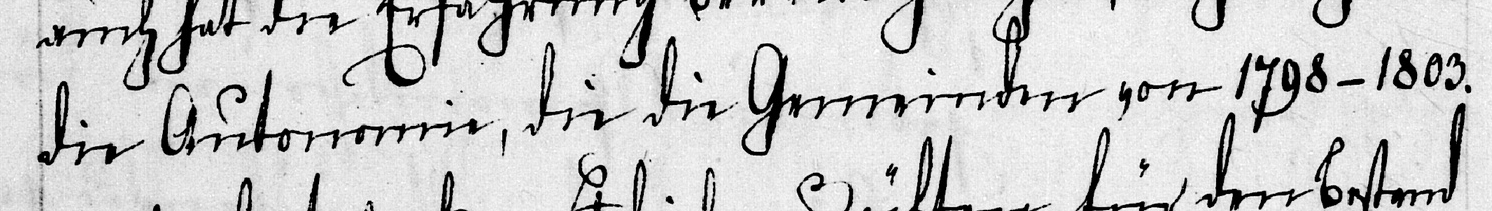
die Autonomie, die die Gemeinden von 1798–1803.
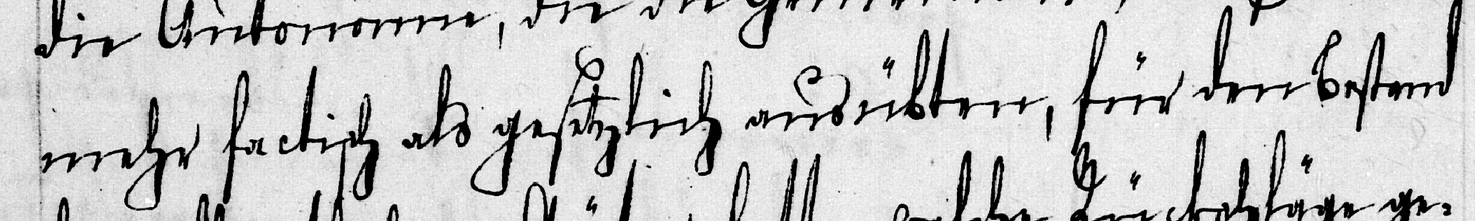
mehr factisch als gesetzlich ausübten, für den Bestand
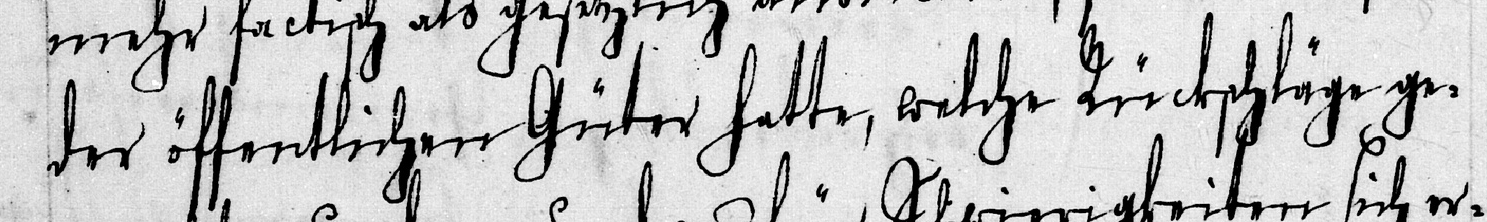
der öffentlichen Güter hatte, welche Rückschläge ge¬
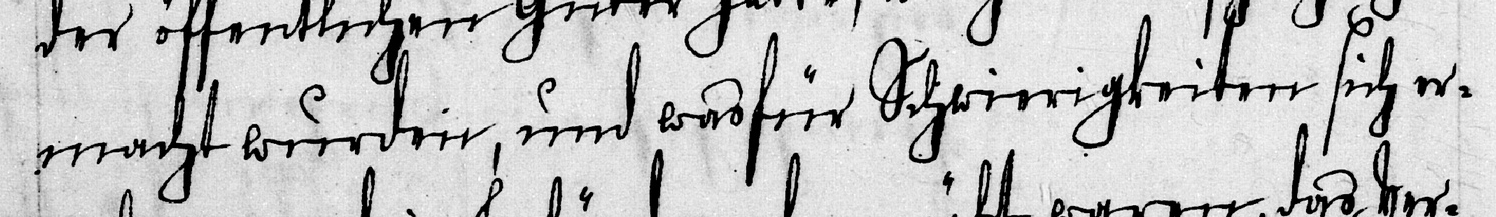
macht wurden, und was für Schwierigkeiten sich er¬
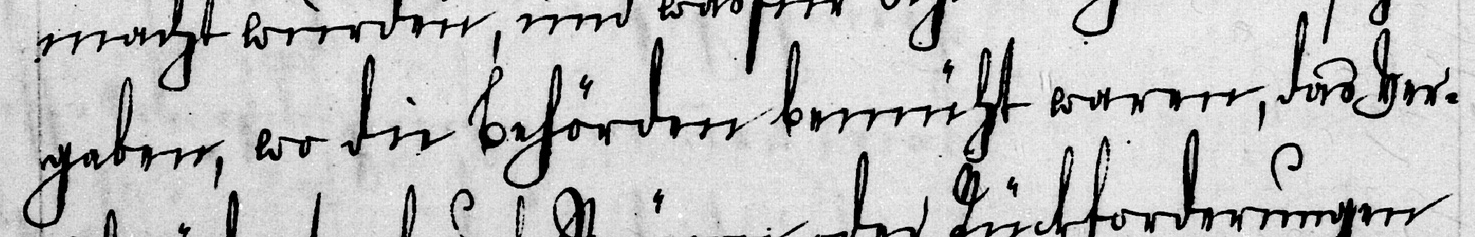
gaben, wo die Behörden bemüht waren, das Ver¬
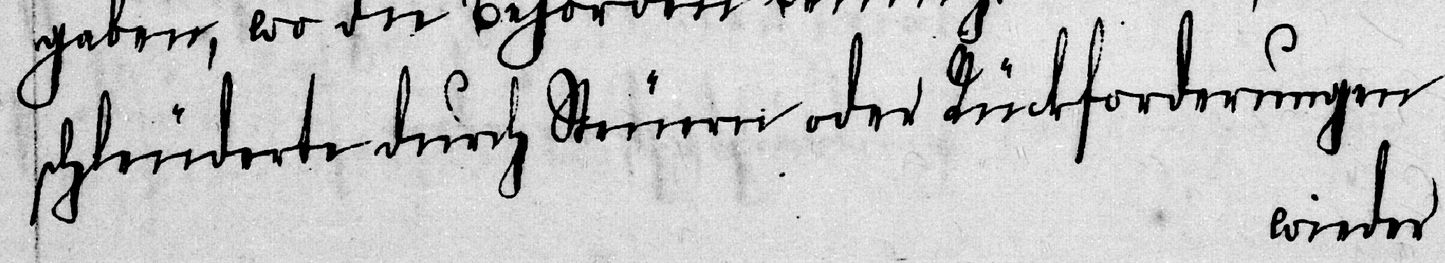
schleuderte durch Steuern oder Rückforderungen
